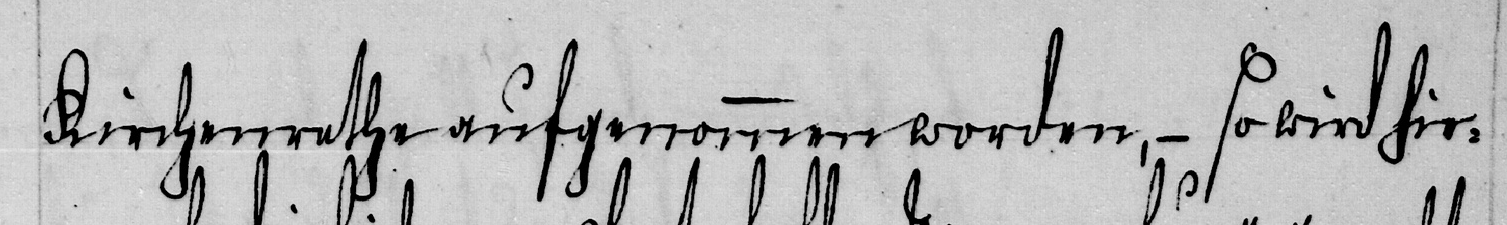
Kirchenrathe aufgenommen worden,– so wird hie¬
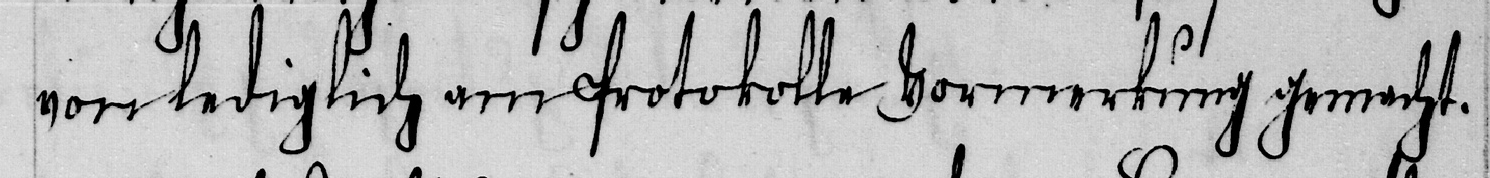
von lediglich am Protokolle Vormerkung gemacht.
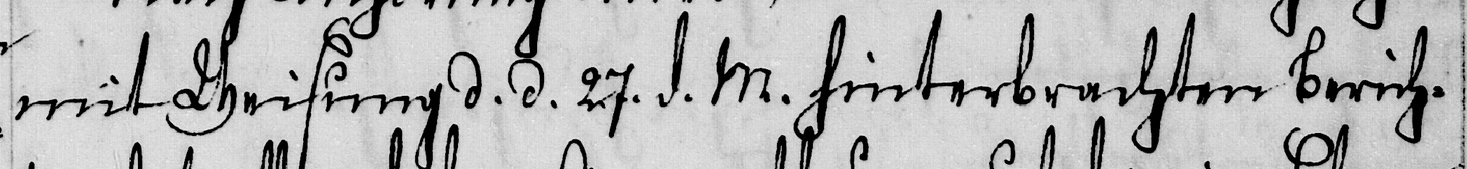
mit Weisung d. d. 27. d. M. hinterbrachten Berich¬
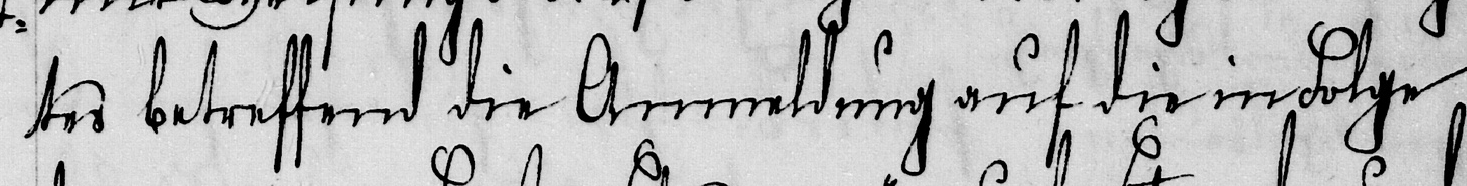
tes betreffend die Anmeldung auf die in Folge
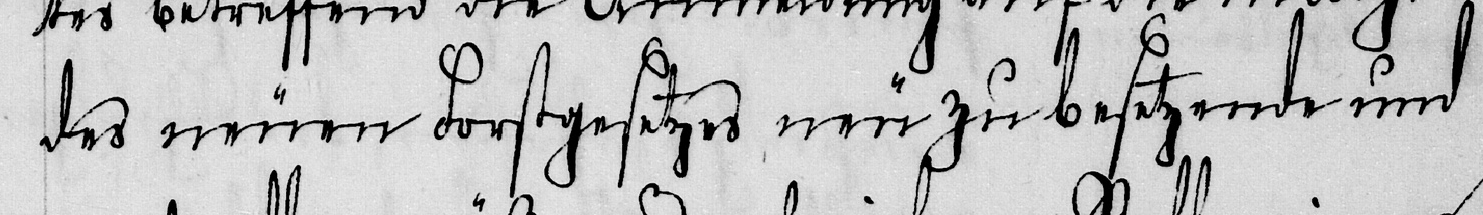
des neuen Forstgesetzes neu zu besetzende und
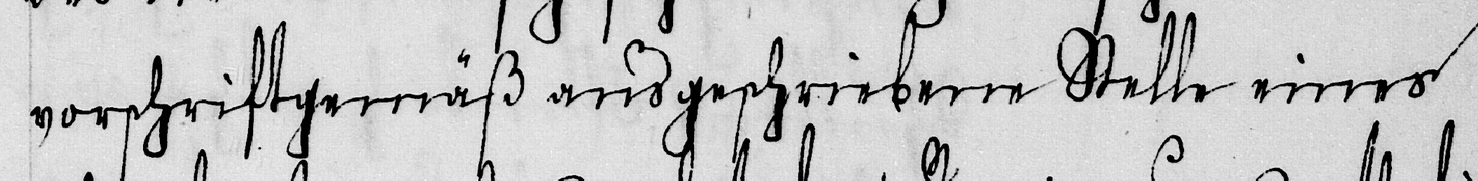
vorschriftsgemäß ausgeschriebene Stelle eines
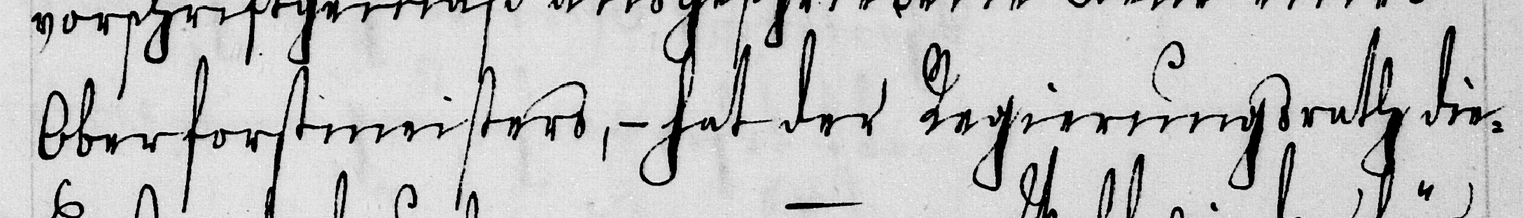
Oberforstmeisters, – hat der Regierungsrath die¬
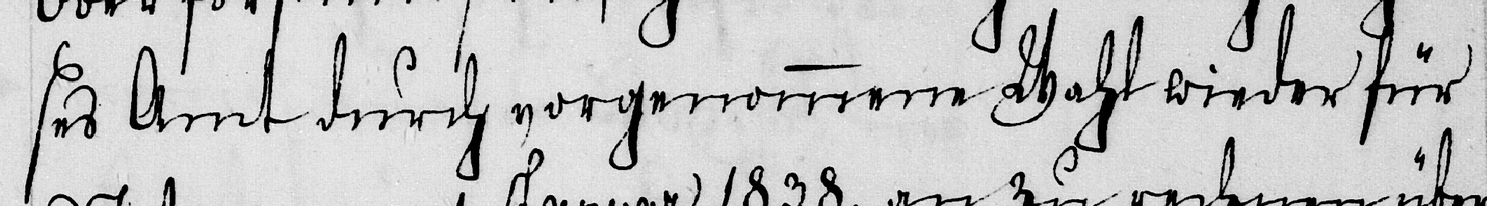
ses Amt durch vorgenommene Wahl wieder für
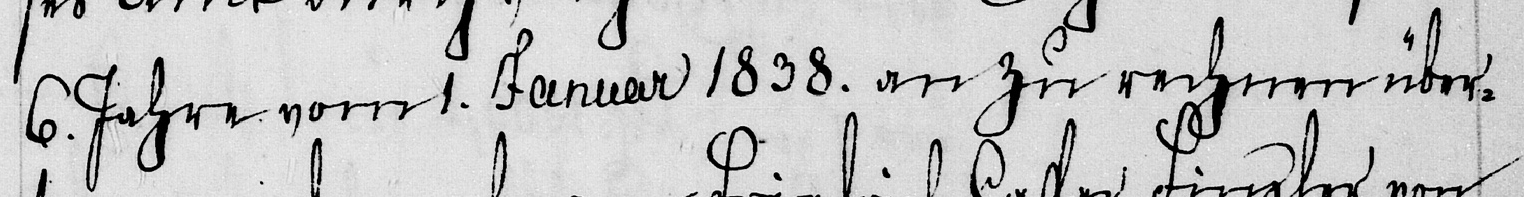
6. Jahre vom 1. Januar 1838. an zu rechnen über¬
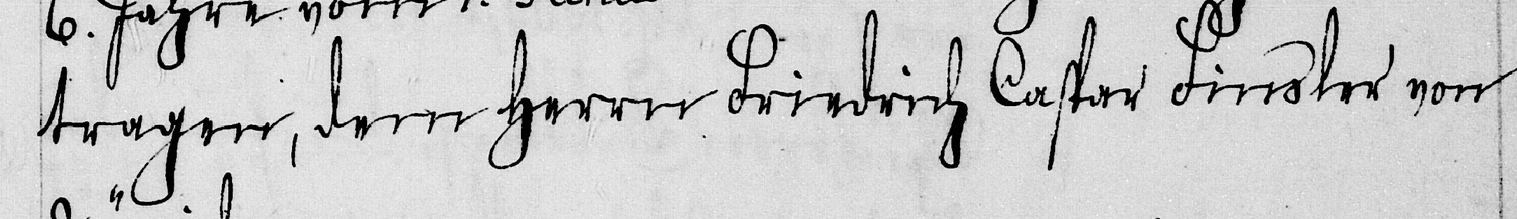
tragen, dem Herren Friedrich Caspar Finsler von
